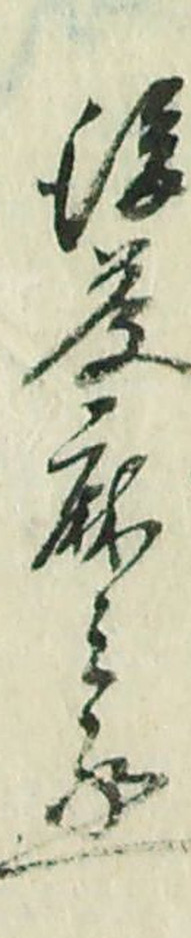後藤麻之丞
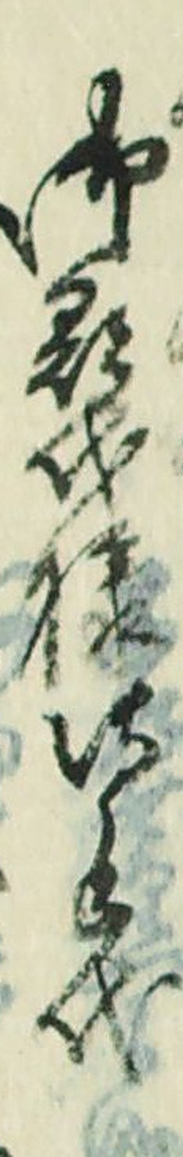御郡代様御手代
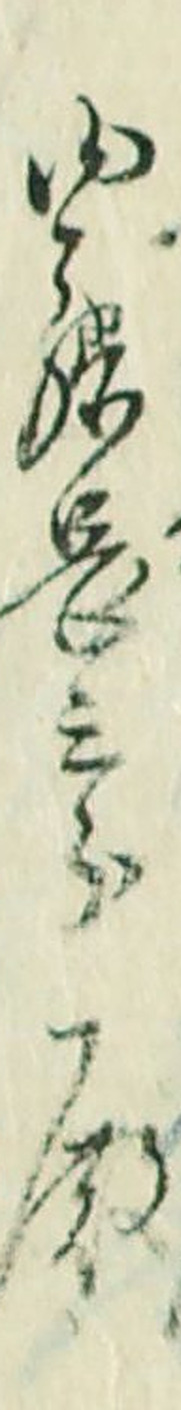内藤長三郎殿
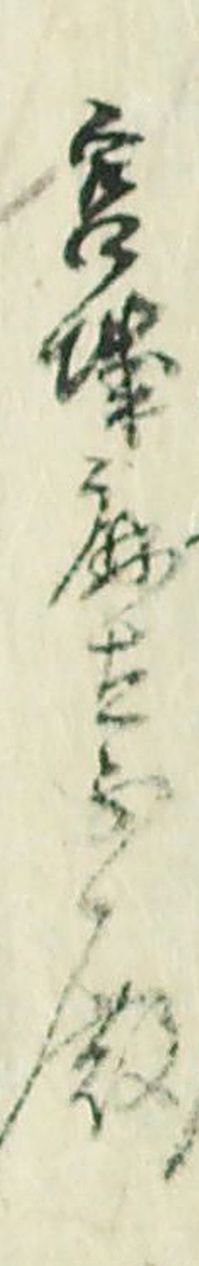宮城麻太郎殿

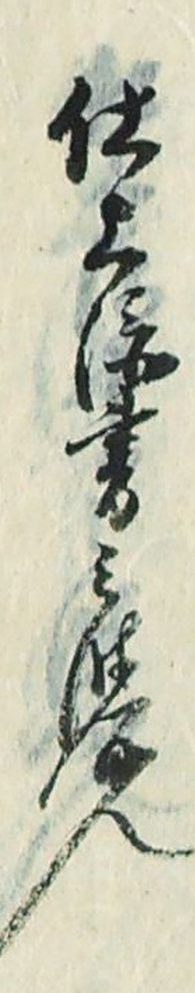仕上添書之覚
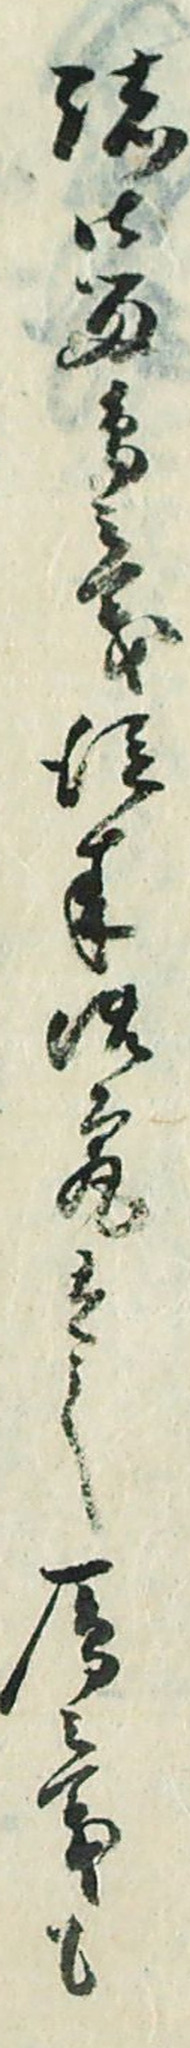諸御留鳥之義従来御究有之鳫之義も
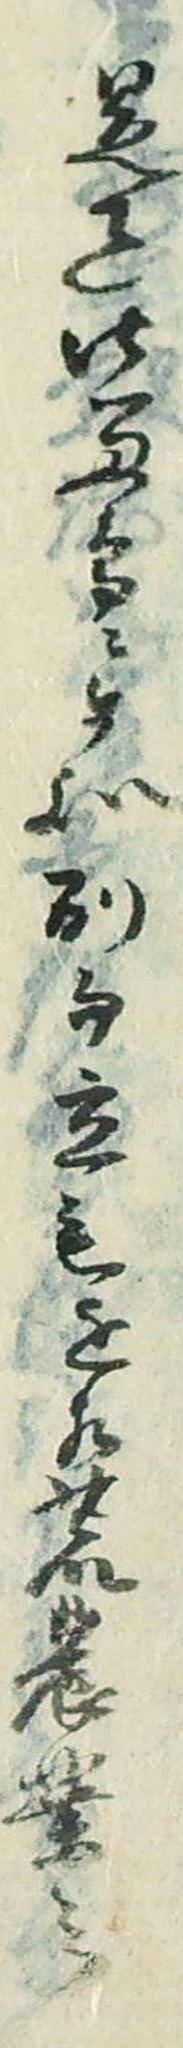是迄御留鳥に候処別而立毛を相荒農業之
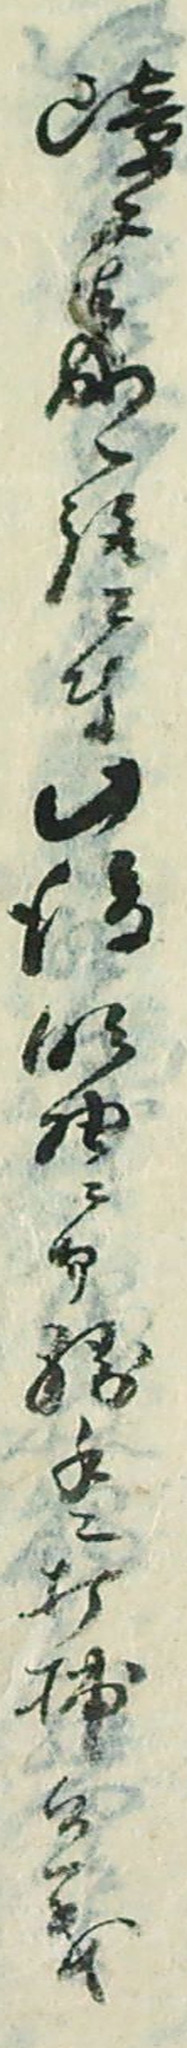障に相成候趣に付此後明野に而勝手に打捕候義
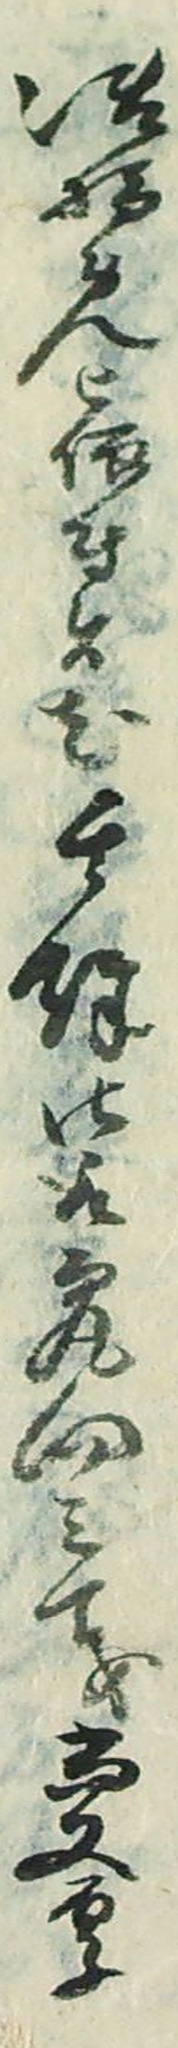御指免被仰付候尤其余御取究向之義尚又厚
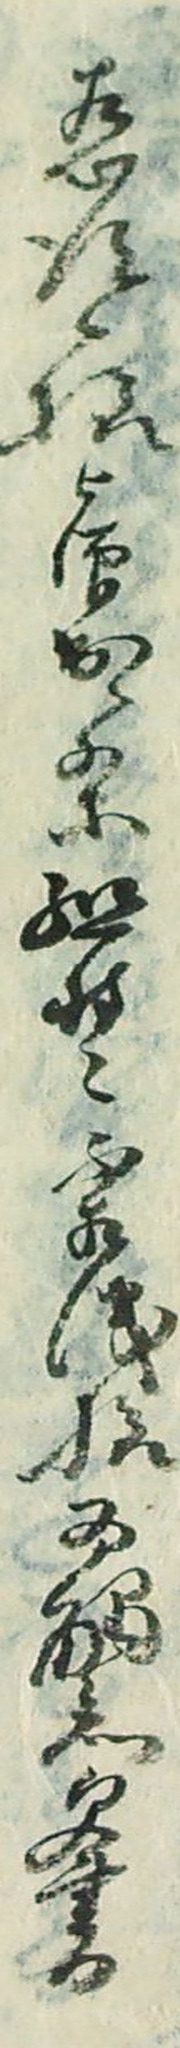相心得候様被仰出候条組村々不相洩様為触知受書
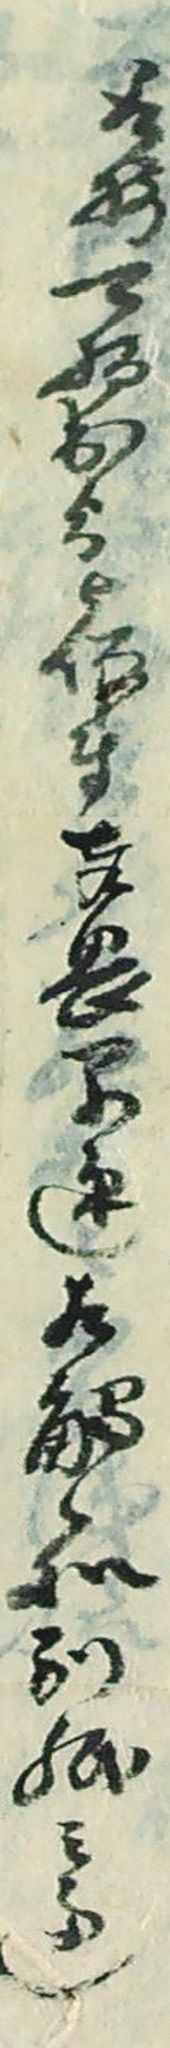取揃可指出旨被仰付奉畏早速相触候処別紙之通
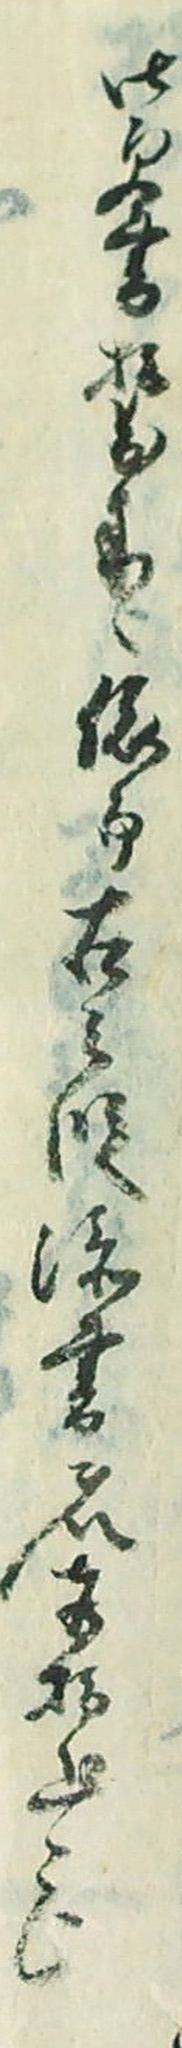御受書指出来候依而右之段添書を以奉指上候以上
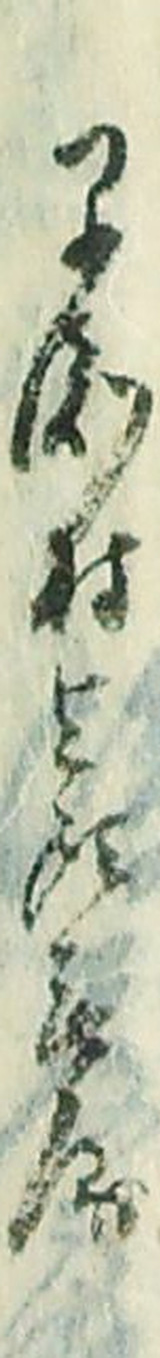早渕村与頭庄屋
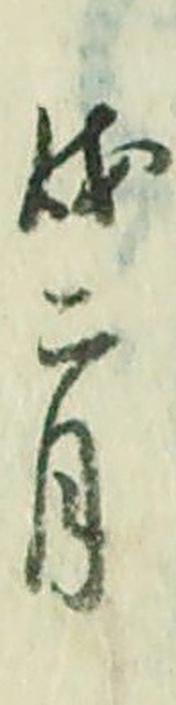戌二月
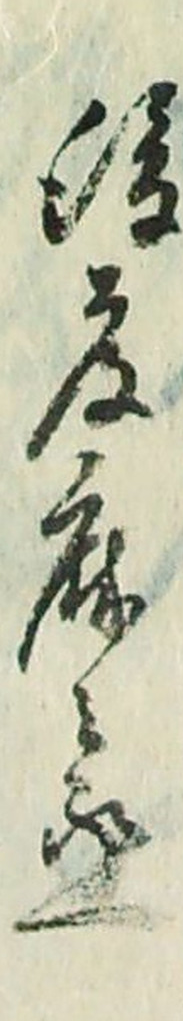後藤麻之丞
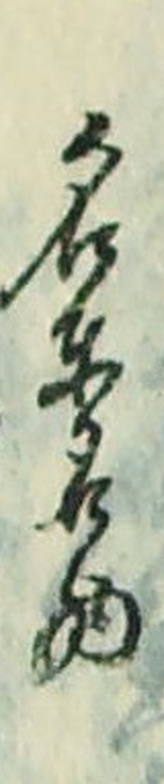名東名西
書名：諸御用御□受書控
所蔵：鳴門教育大学 Naruto University of Education
